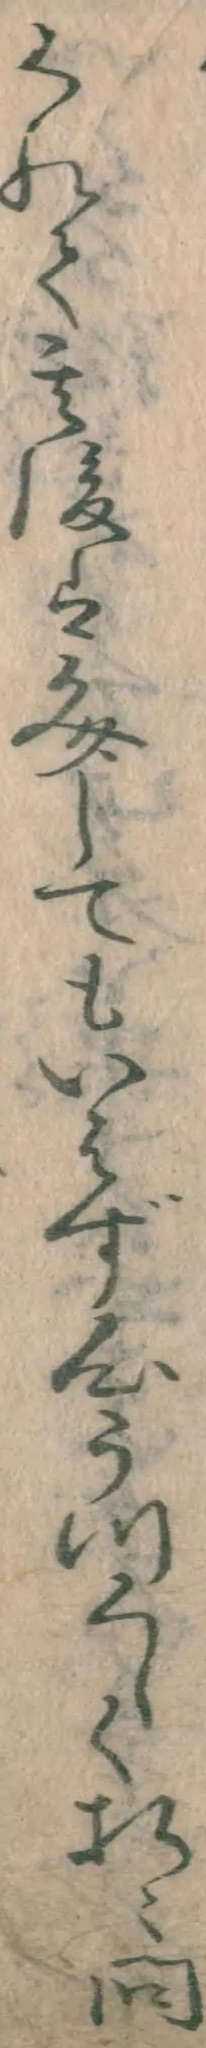くれて其の後は文してもいはず心うつくしく折々問
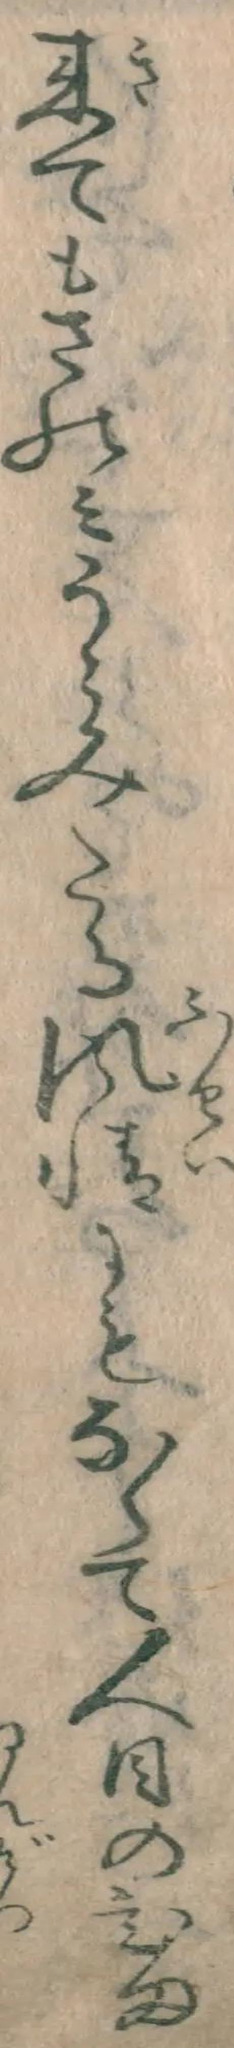来てもさのみうとみたる風情にもならて人目のひま
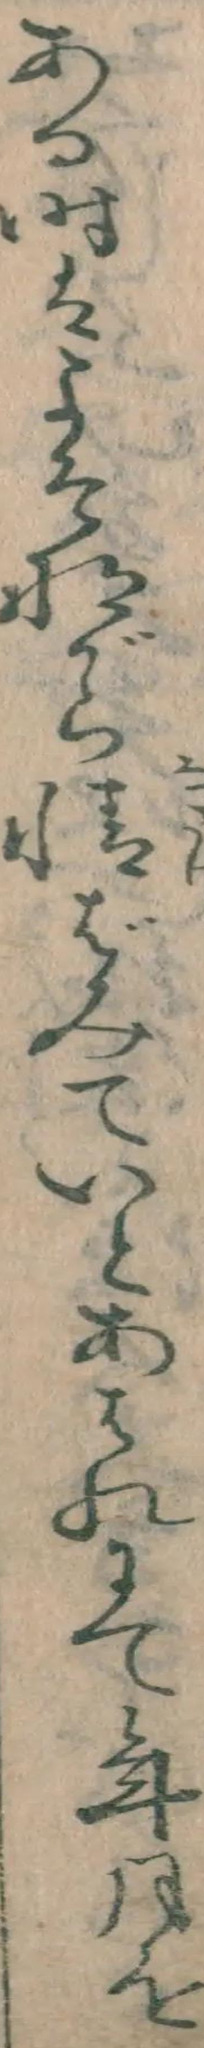ある時はよそながら情ばみていとあはれにて年月を

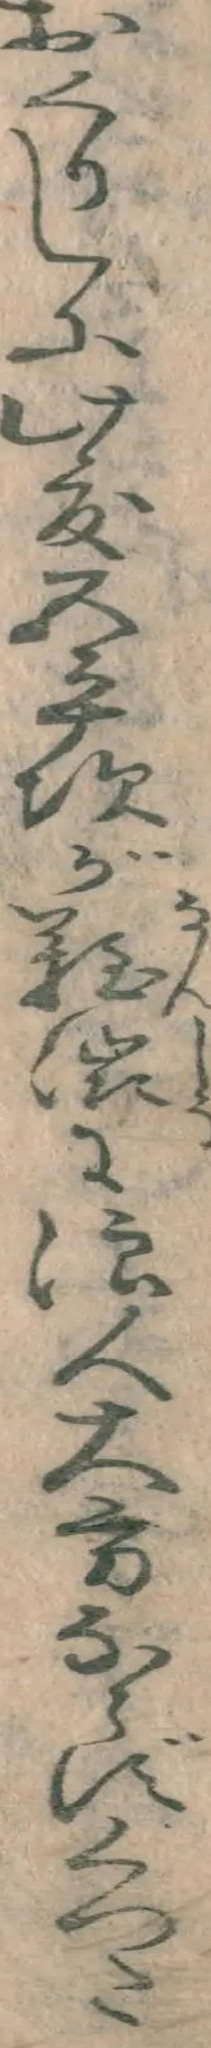おくりしに此度五平次が難渋に浪人大方ならずくつた
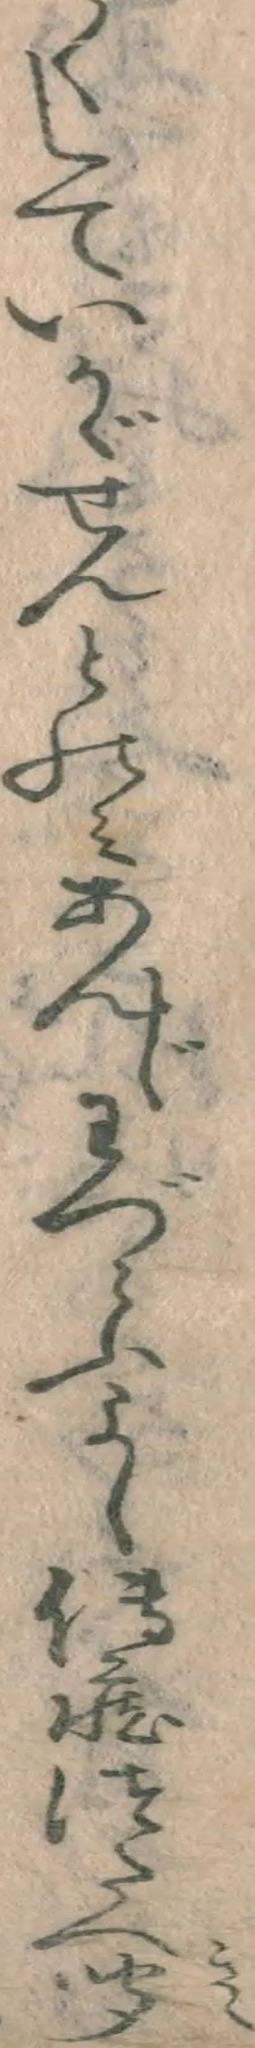くしていかゞせんとのみあんじわづらふよし伝蔵つたへ聞
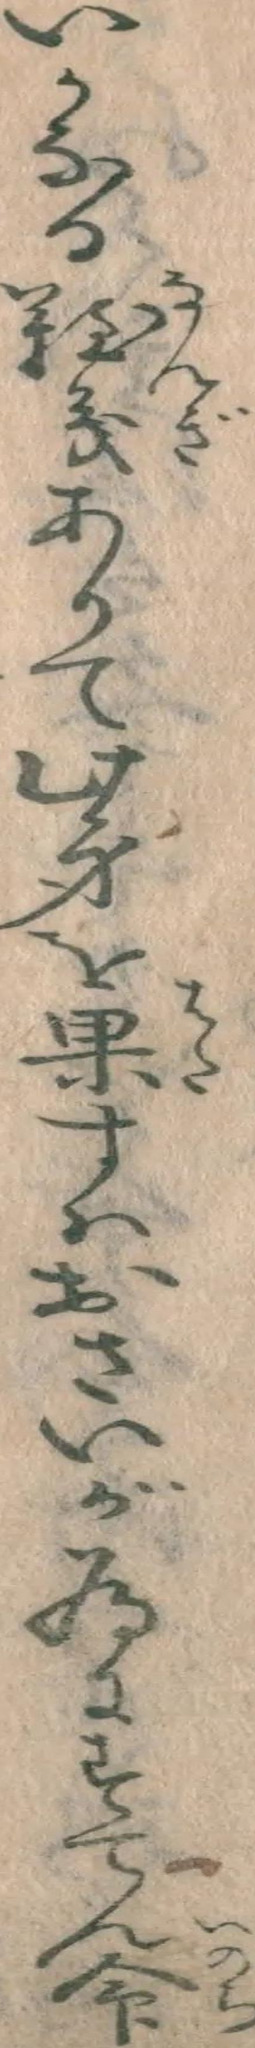いかなる難義ありて此身を果すはおさいが為にすてん命
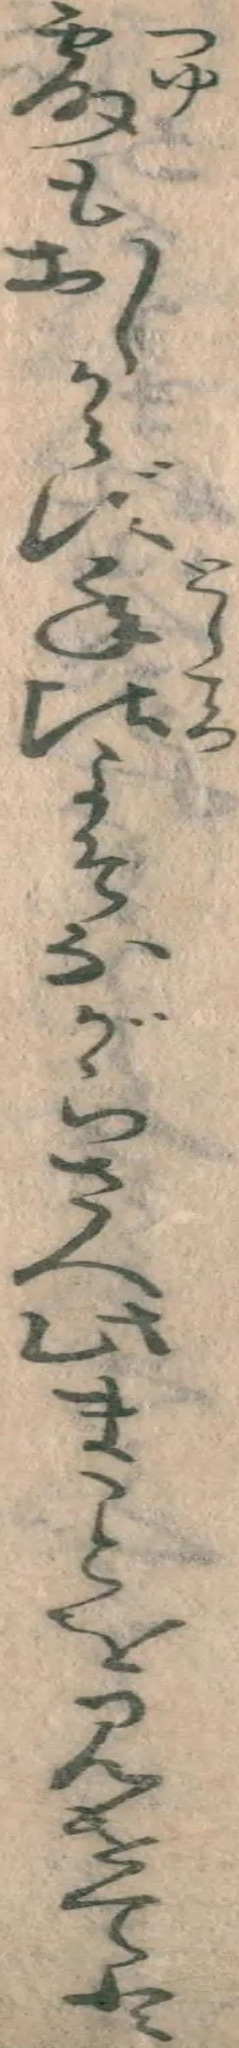露もおしからず年頃よそながらさへ此まことを見せてと
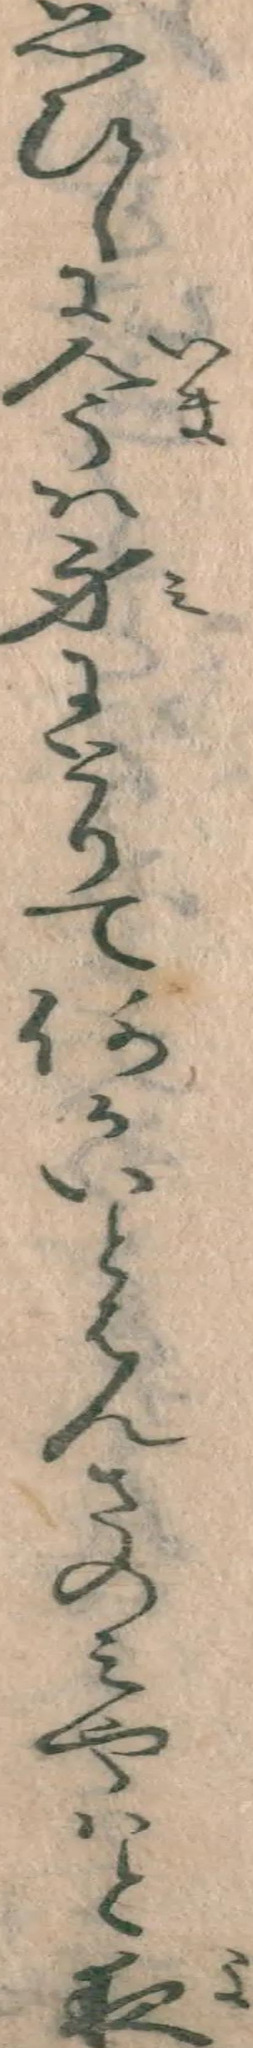思ひしに今は身にとりて何かいとはんさのみやはと夜
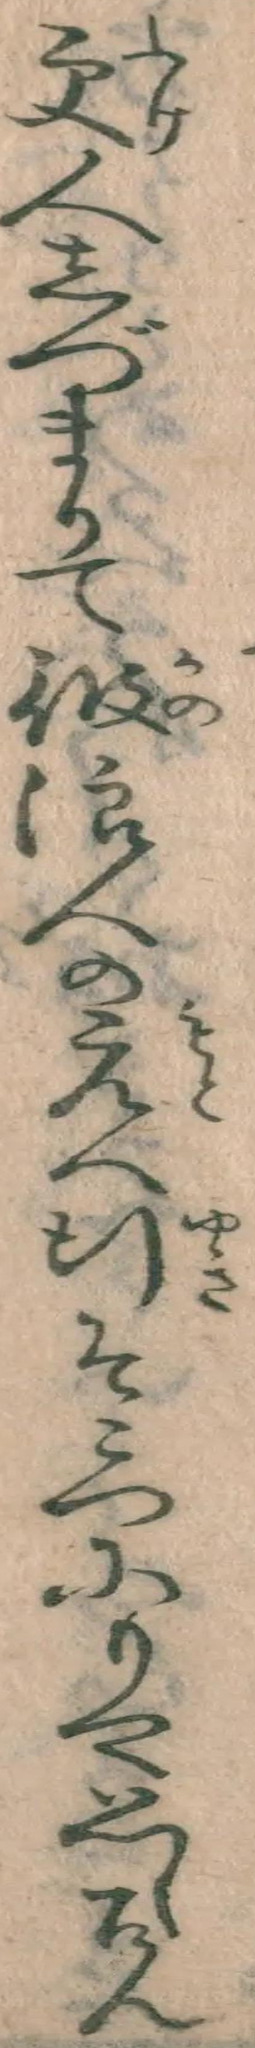更人しづまりて彼浪人の元へ行そこつにもや思し召ん
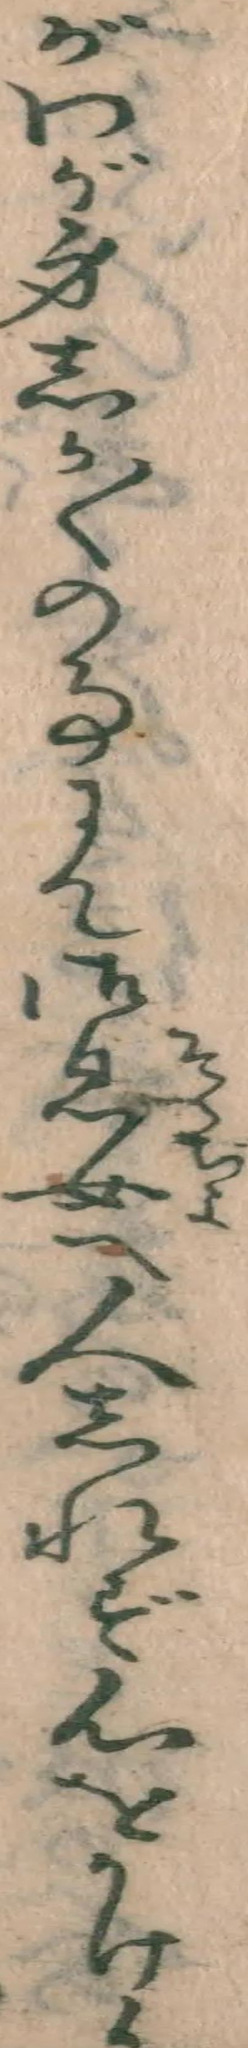がわが身しか〳〵の事にて御息女へ人しれず心をかけ候
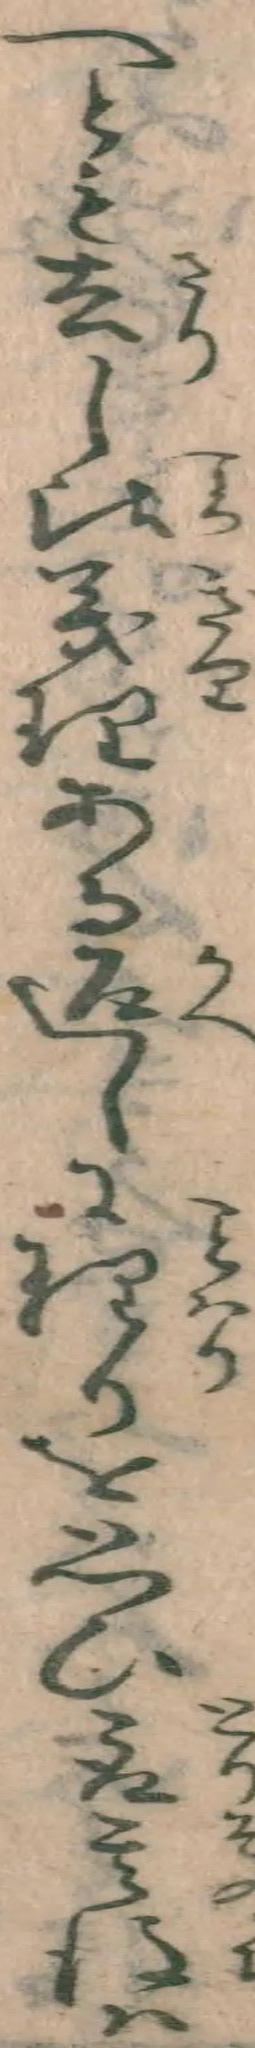へとも去し頃義理ある返しに理りを思ひ取其後は
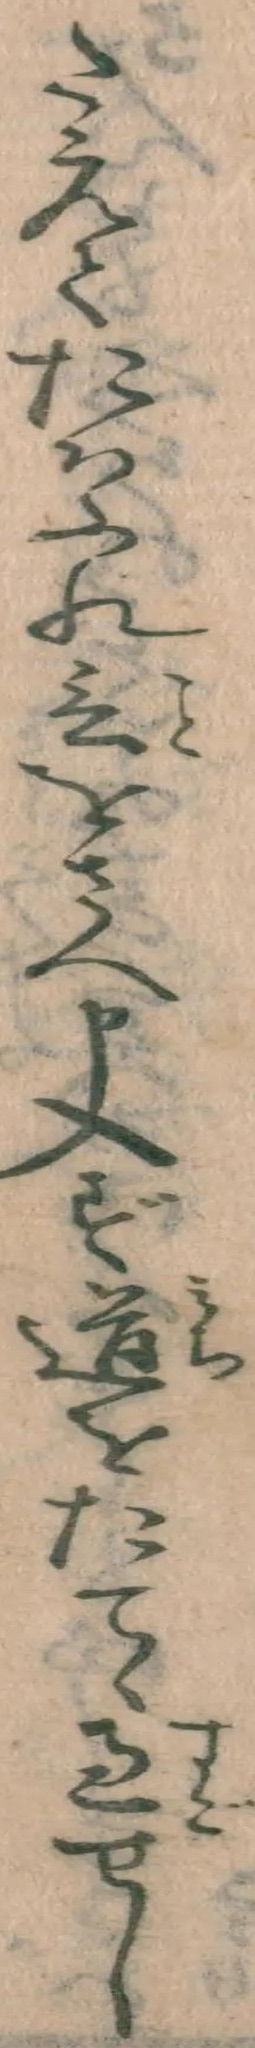たえてたはふれ言をさへ申入ず道をたてゝ過せし
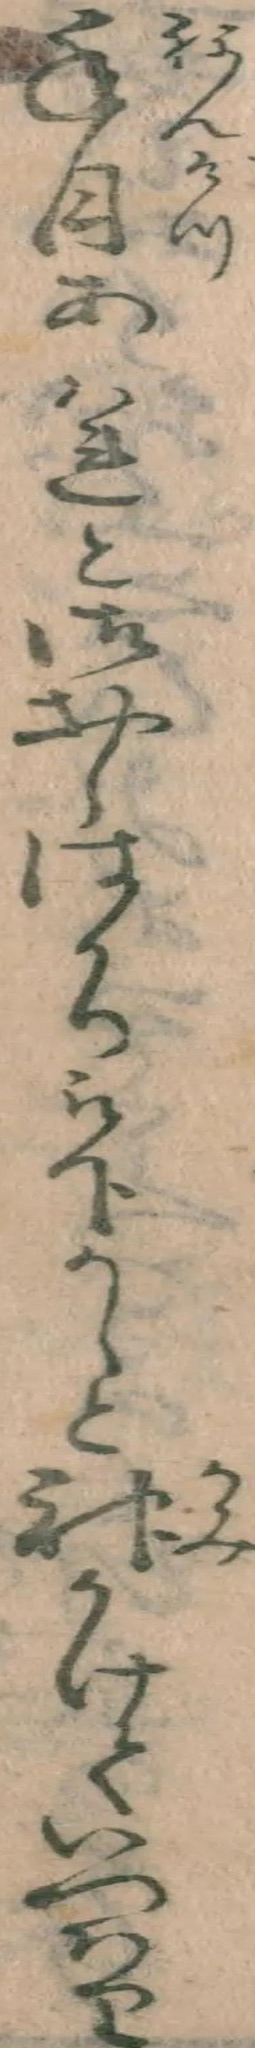年月あはれと御おしはかり被下かしと神かけていつはり
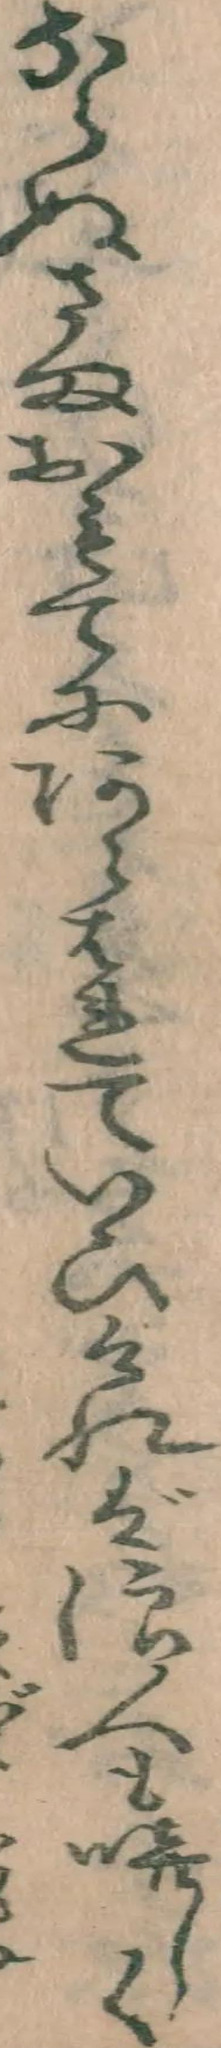ならぬさまおもてにあらはれていひければ浪人も嬉しく
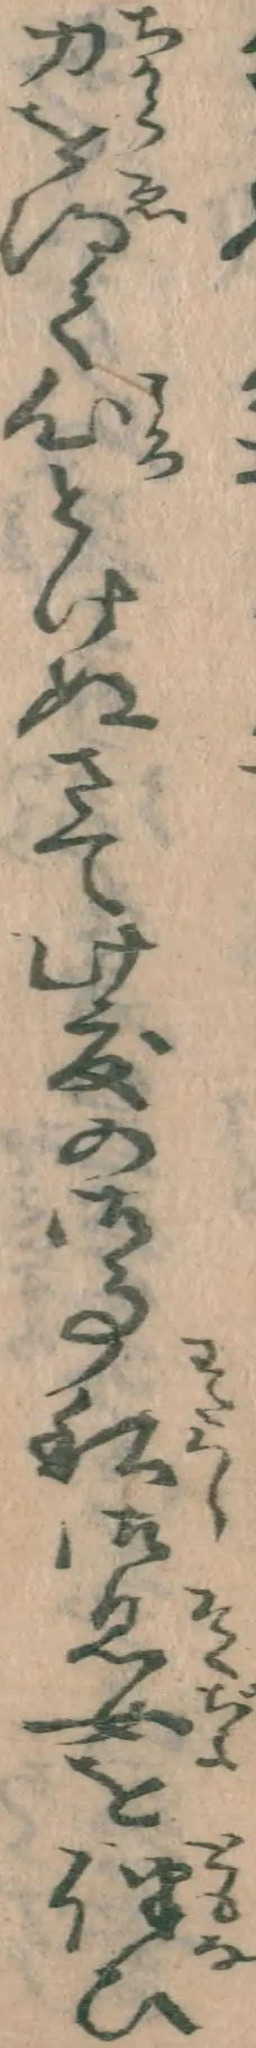力を得て心とけぬさて此度の御事私御息女を伴ひ
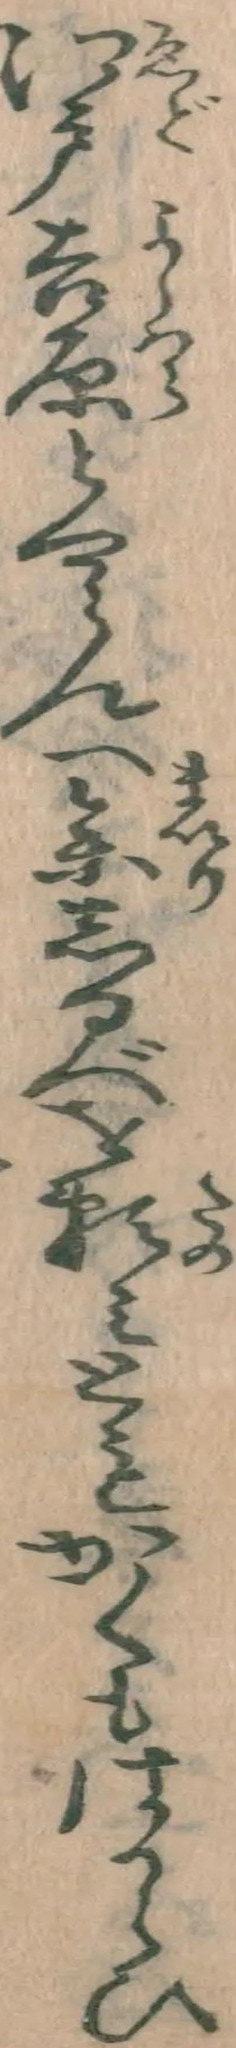江戸吉原とやらんへ参しるべを頼みともかくもはからひ
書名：怪談御伽童 5巻. [2]
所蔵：国立国会図書館 National Diet Library, JAPAN
